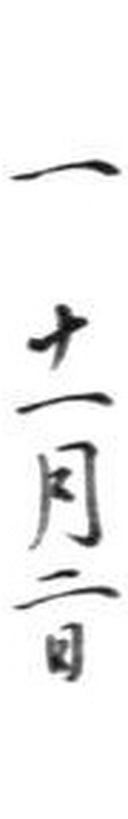一十一月二日
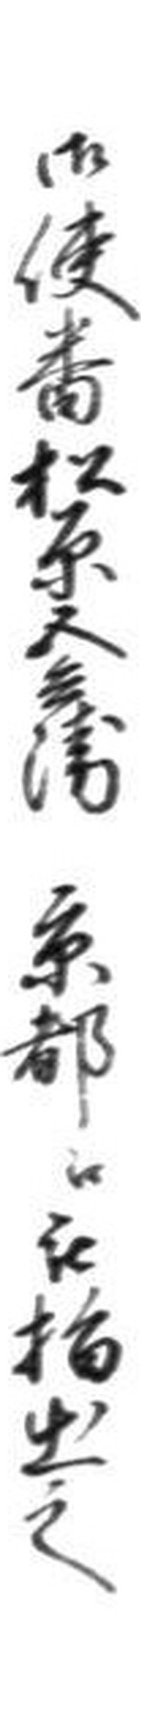御使番松原五兵衛京都江被指出之

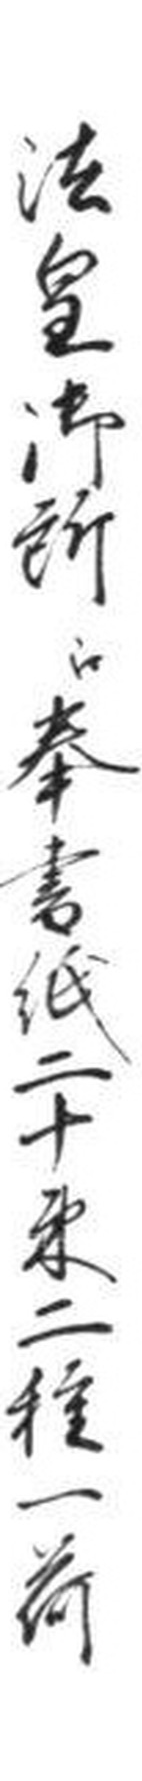法皇御所江奉書紙二十束二種一荷
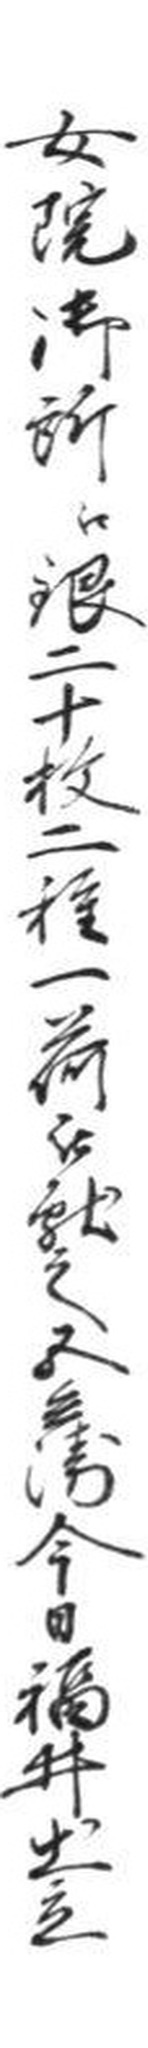女院御所江銀二十枚二種一荷被献之五兵衛今日福井出立
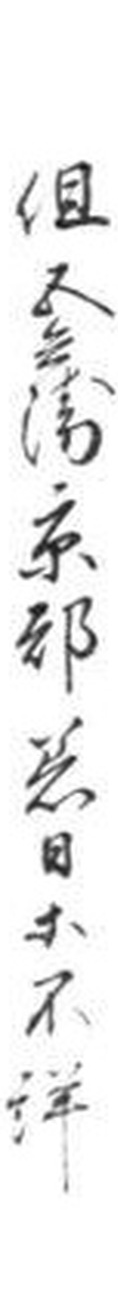但五兵衛京都着日等不詳
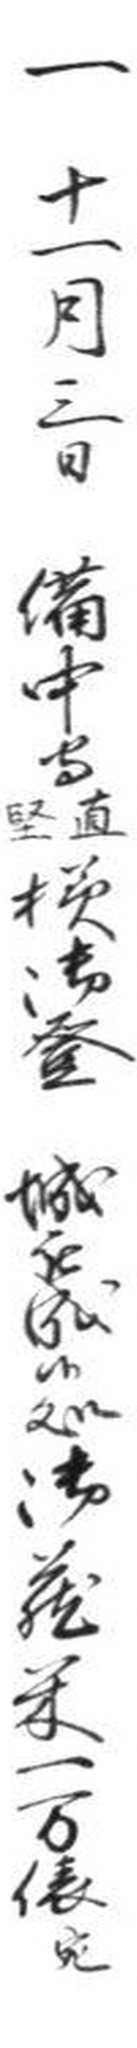一十一月三日備中守直堅様御登城被成候処御蔵米一万俵宛
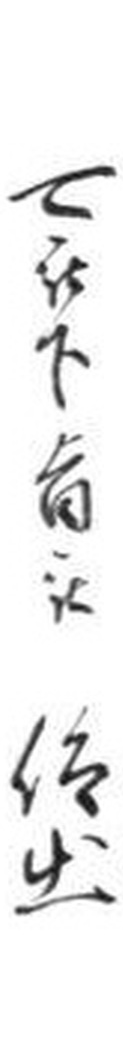可被下旨仰出
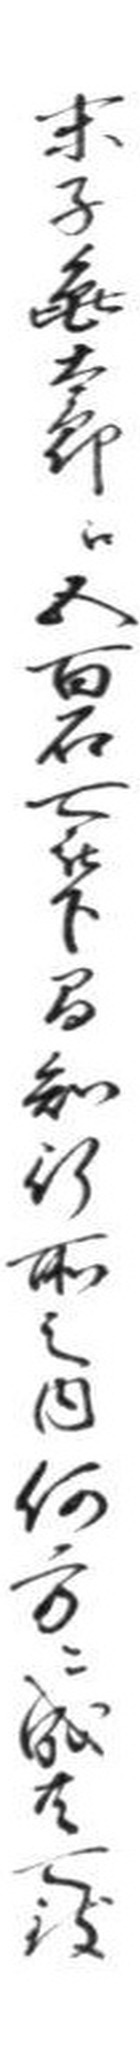末子亀太郎江五百石可被下間知行所之内何方ニ成共可致
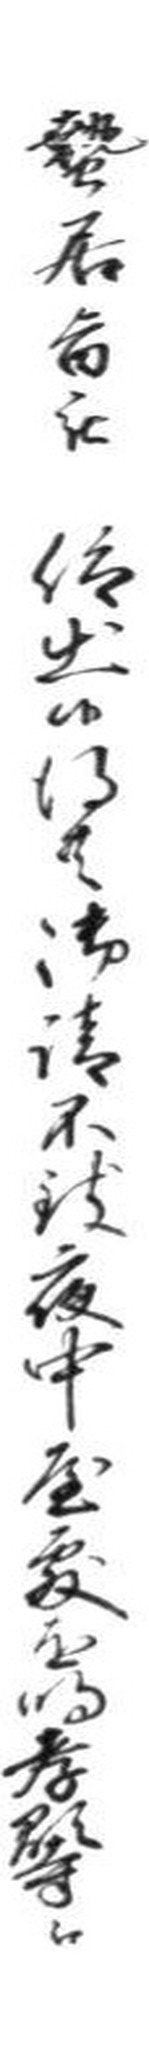蟄居旨被仰出候得共御請不致夜中屋敷を明孝顕寺江
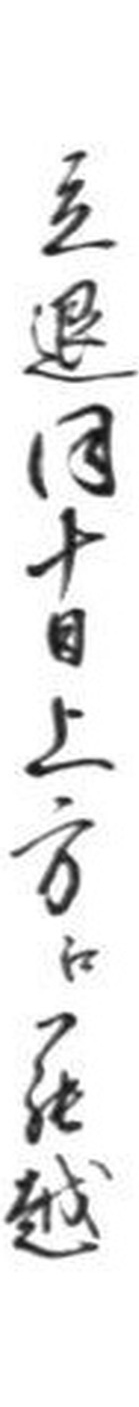立退同十日上方江罷越
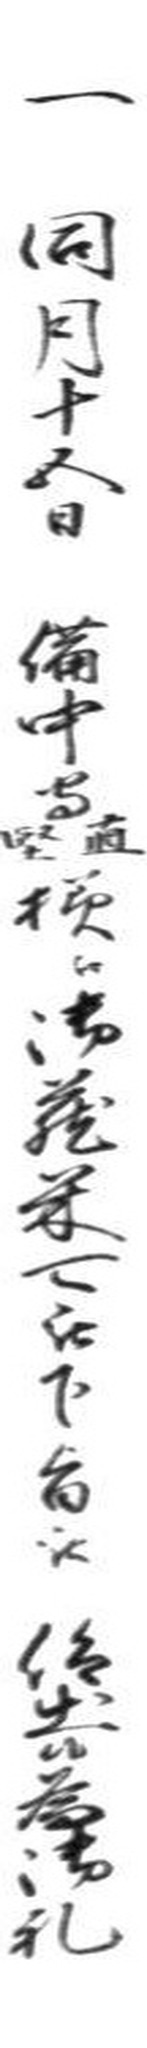一同月十五日備中守直堅様江御蔵米可被下旨被仰出候為御礼
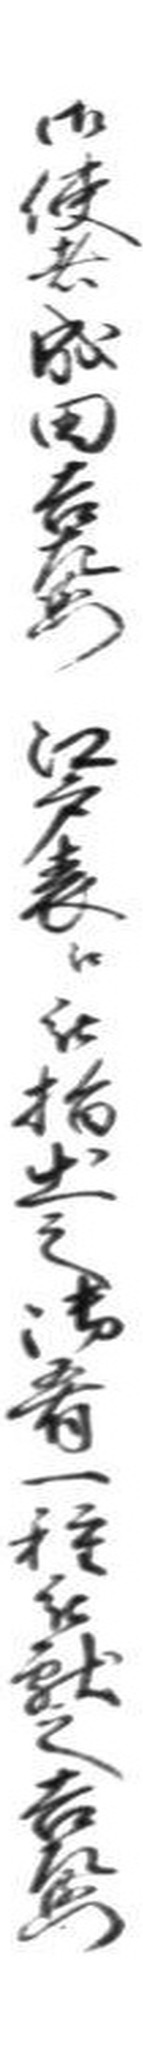御使者成田吉左衛門江戸表江被指出之御肴一種被献之吉左衛門
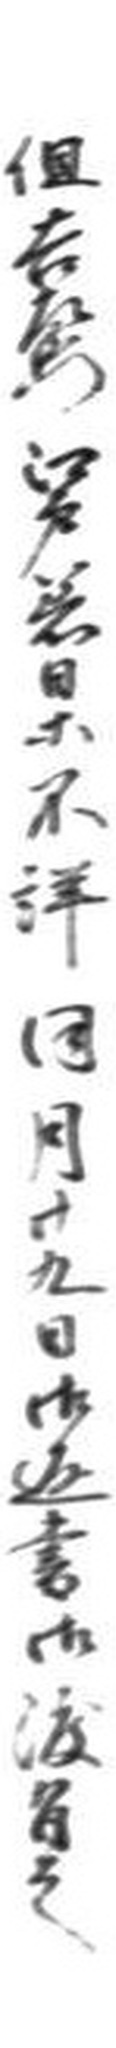但吉左衛門江戸着日等不詳同月廿九日御返書御渡有之
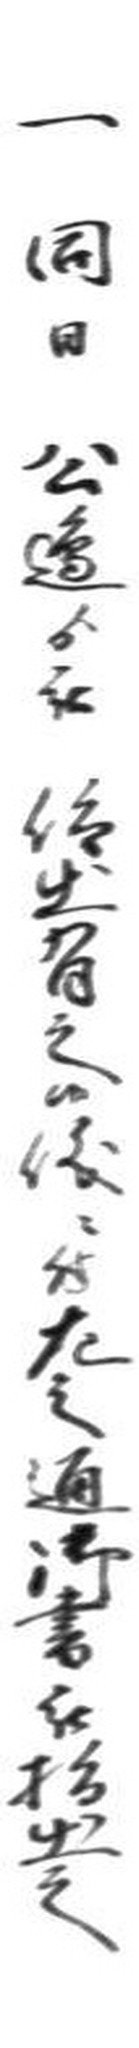一同日公辺ゟ被仰出有之候儀ニ付左之通御書被指出之
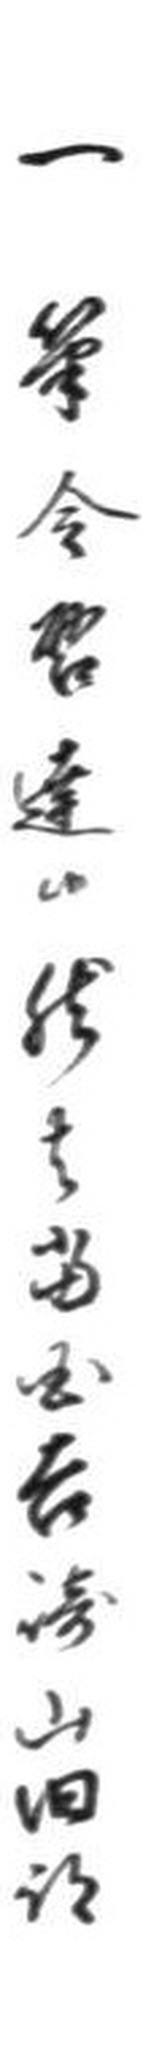一筆令啓達候然者当国吉崎山旧跡

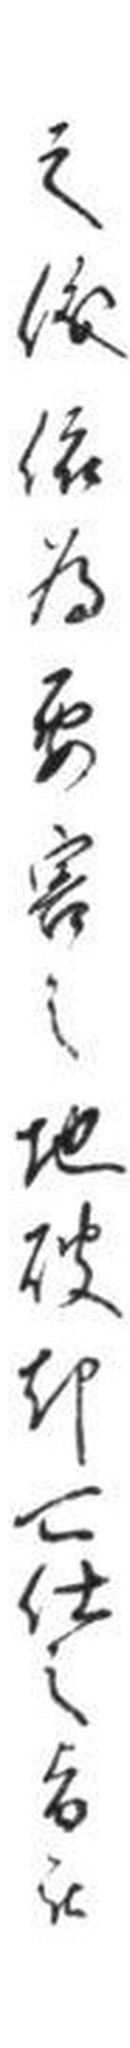之儀依為要害之地破却可仕之旨被
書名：家譜 十三 綱昌公 従寛文元年到延宝五年
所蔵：福井県文書館 Fukui Prefectural Archives
